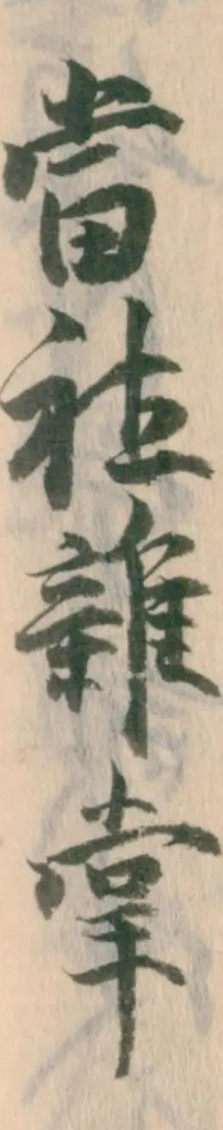当社雑掌
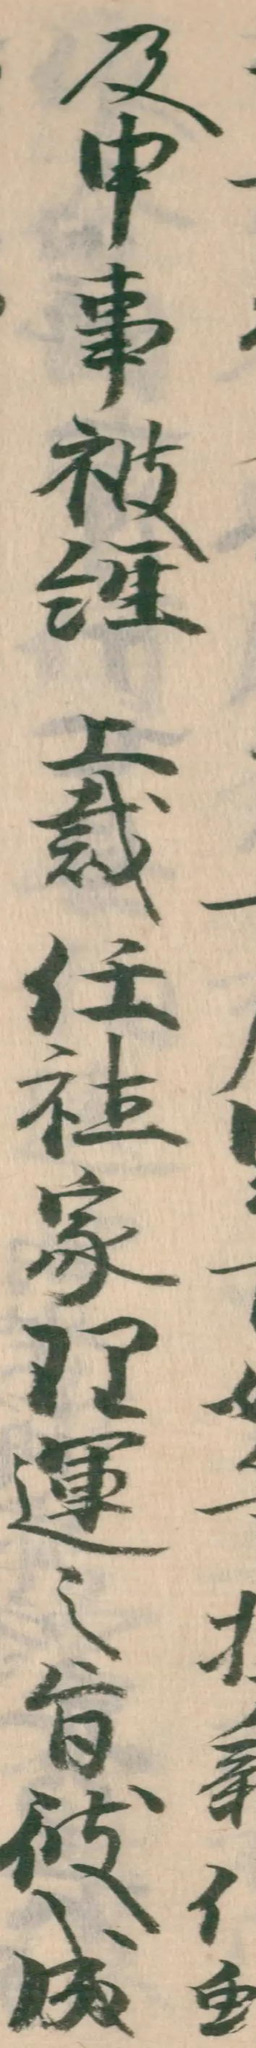及申事被経上裁任社家理運之旨被成
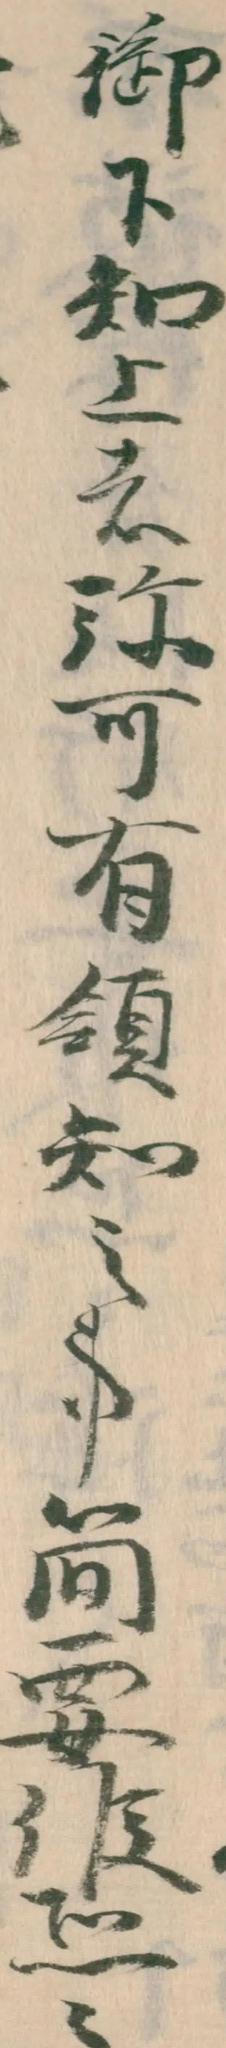御下知上者弥可有領知之事簡要候恐々
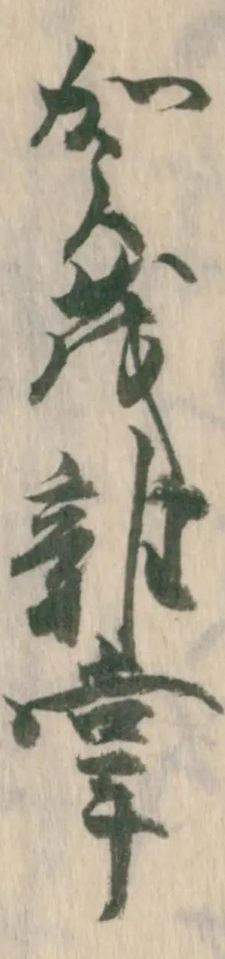賀茂雑掌
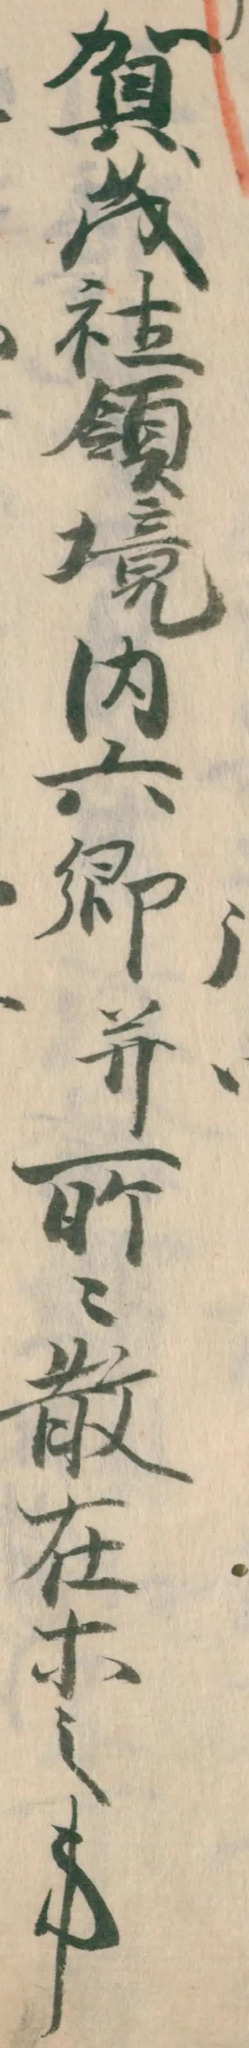賀茂社領境内六郷并所々散在等之事
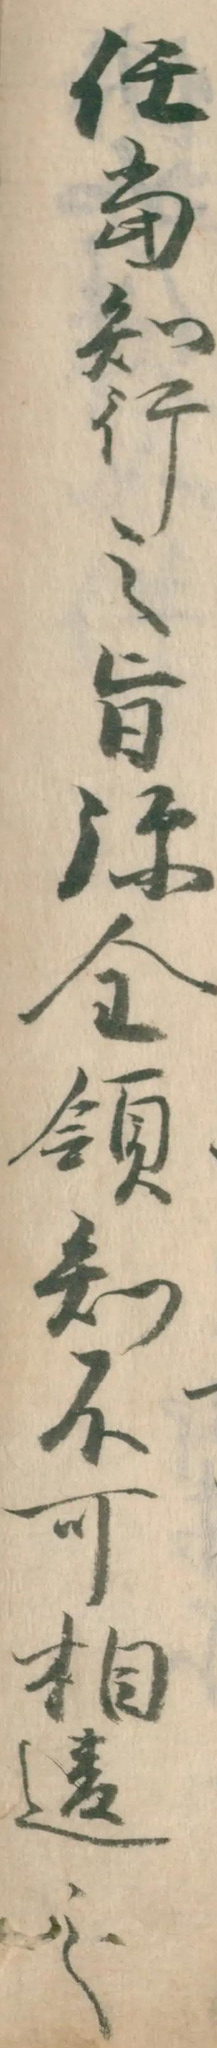任当知行之旨弥全領知不可相違之

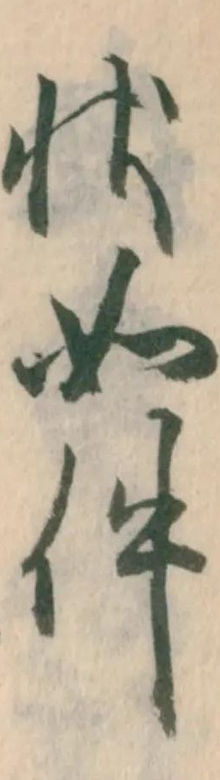状如件
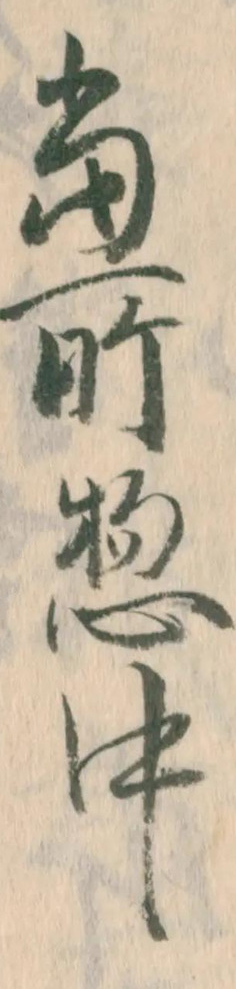当所惣中
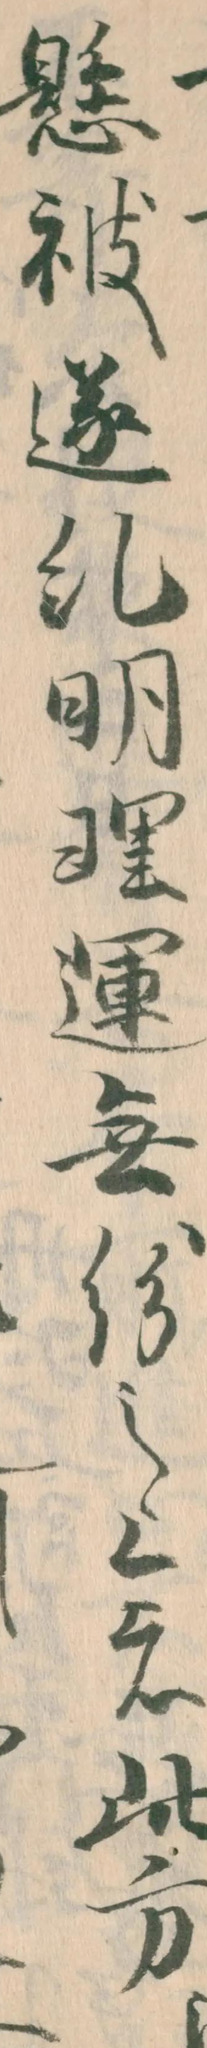懸被遂糺明理運無紛之上者此方え
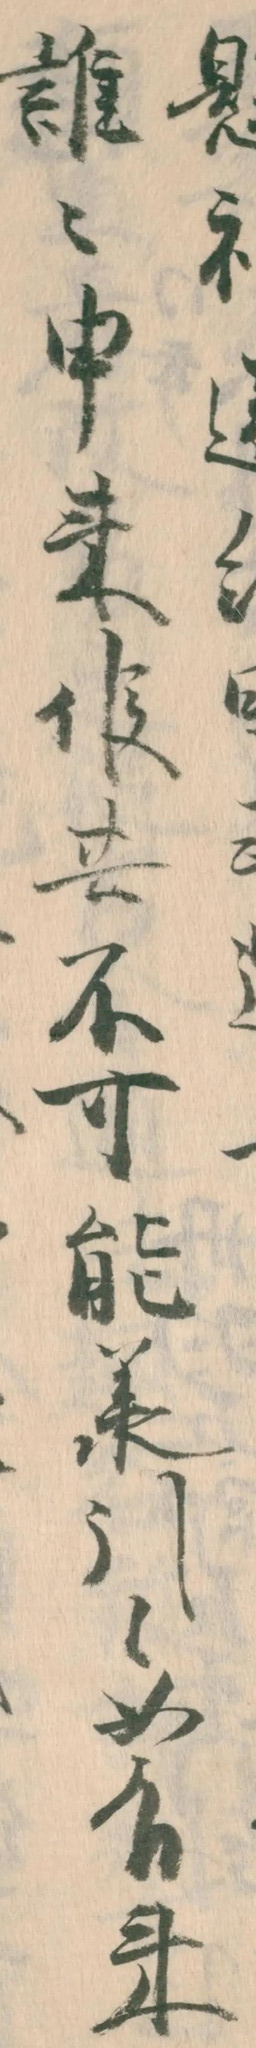誰々申来候共不可能承引候如有来
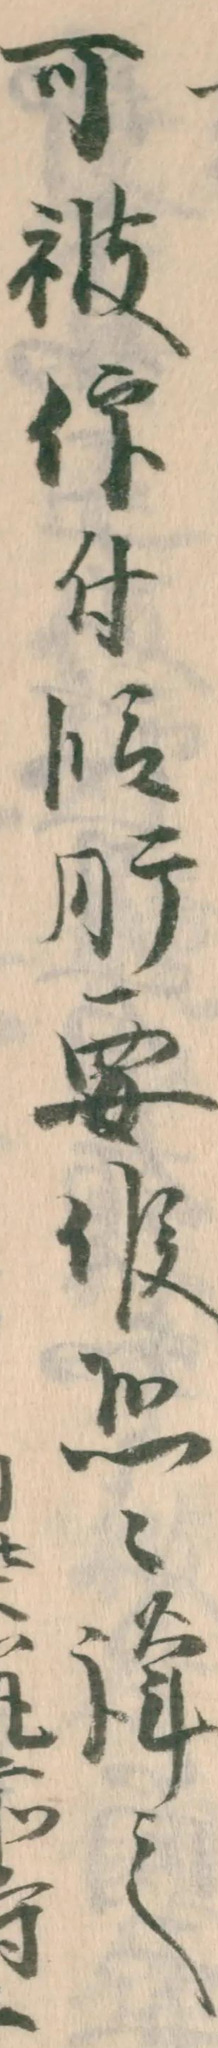可被仰付段肝要候恐々謹言
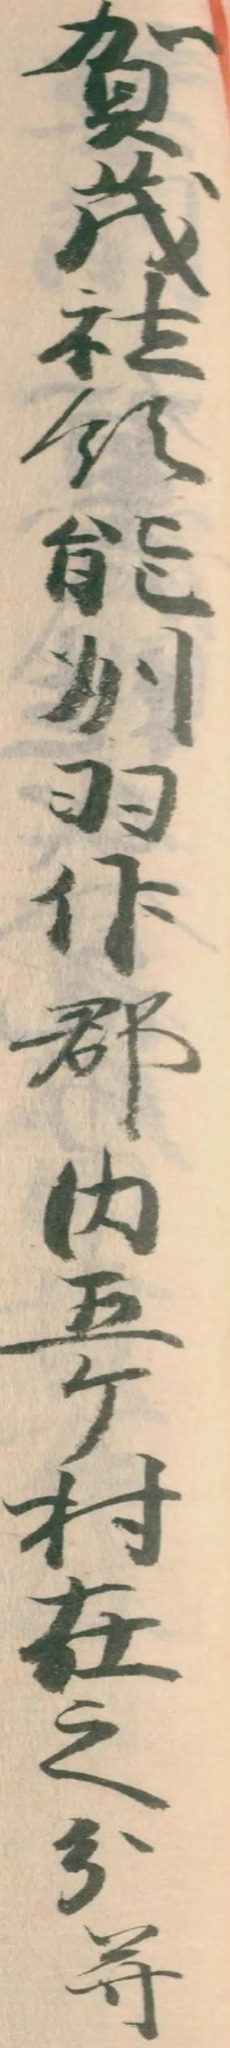賀茂社領能州羽作郡内五ヶ村在之分并
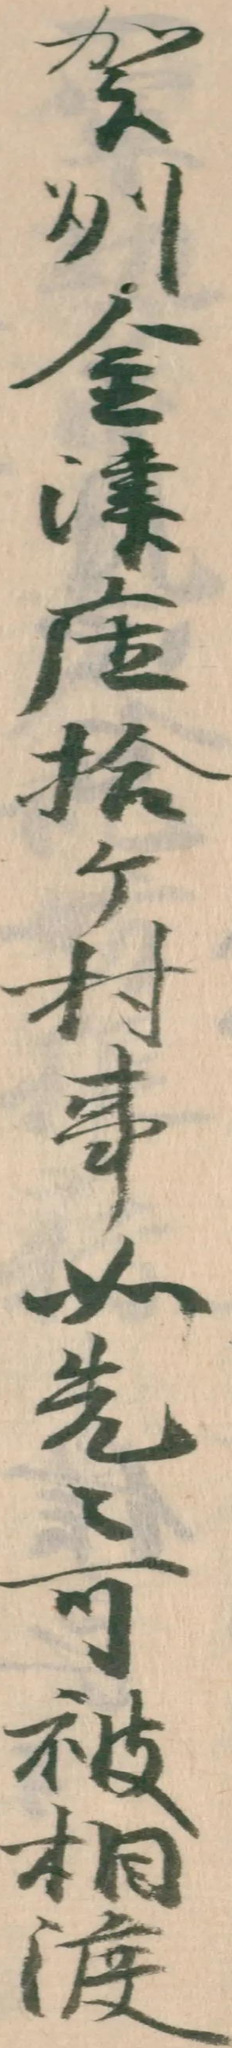賀州金津庄拾ヶ村事如先々可被相渡
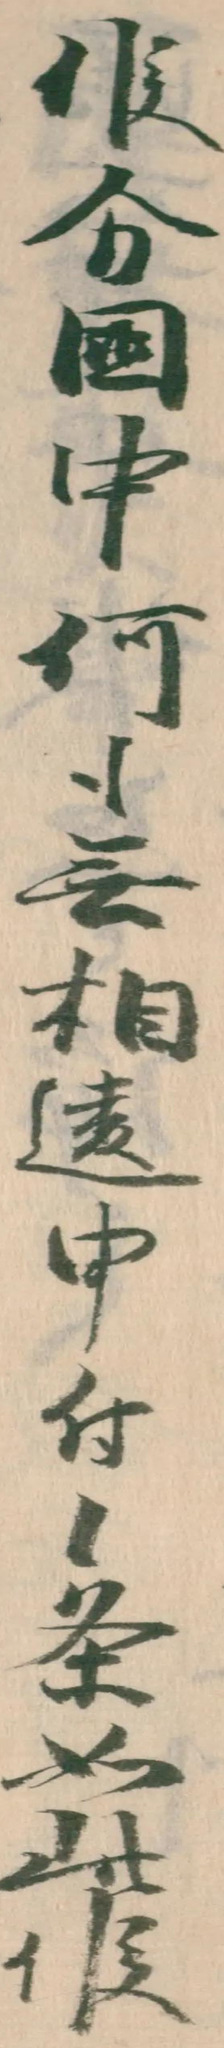候分国中何も無相違申付候条如此候
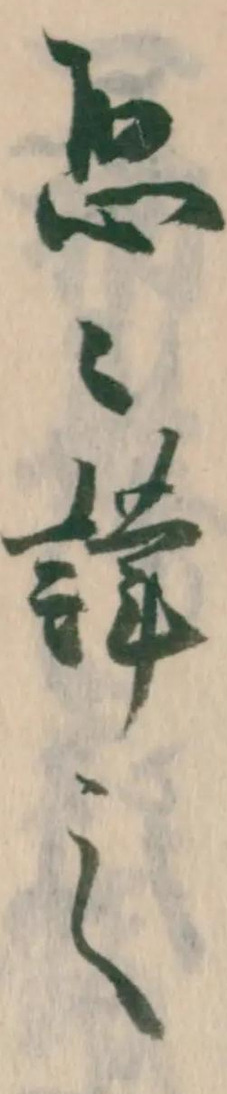恐々謹言
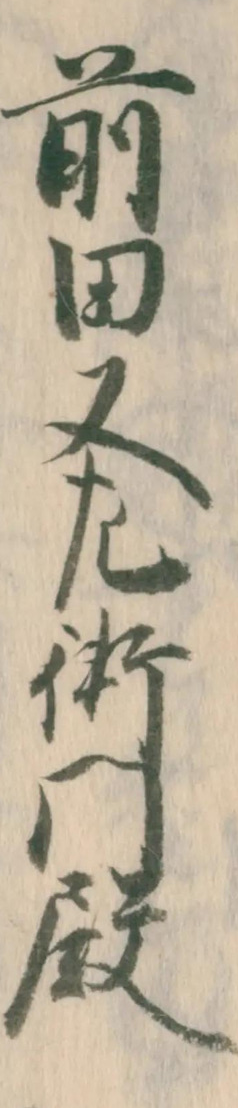前田又左衛門殿
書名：賀茂社記録. 第1冊
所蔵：国立国会図書館 National Diet Library, JAPAN
